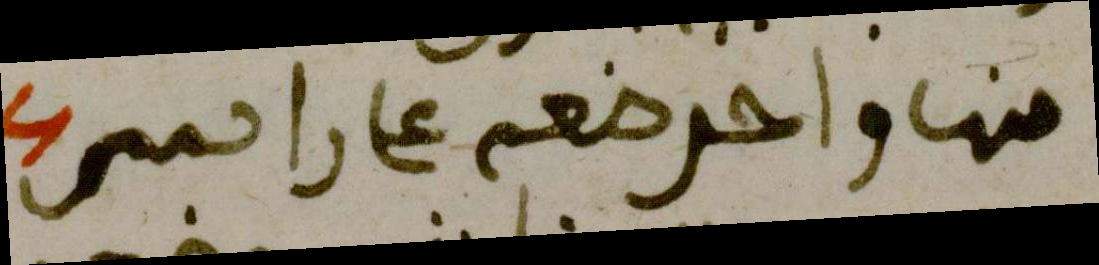منها واحد ضعه على راس
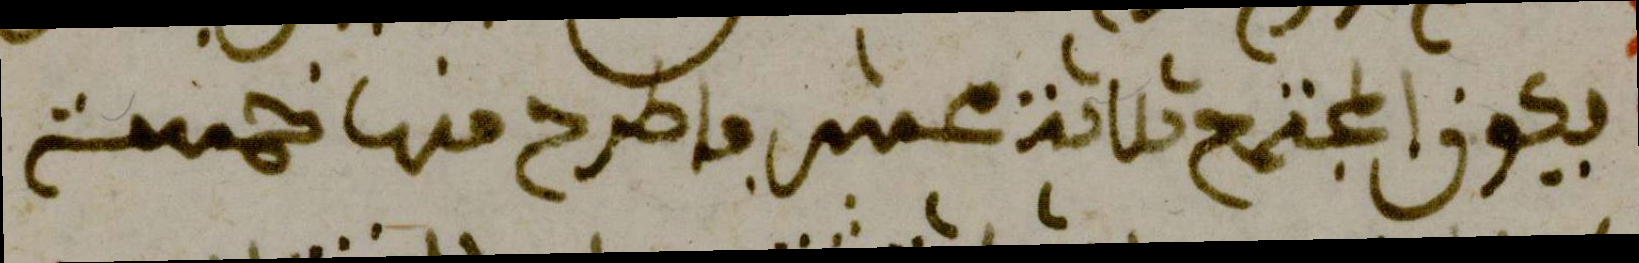فيكون المجتمع ثلاثة عشر فاطرح منها خمسة
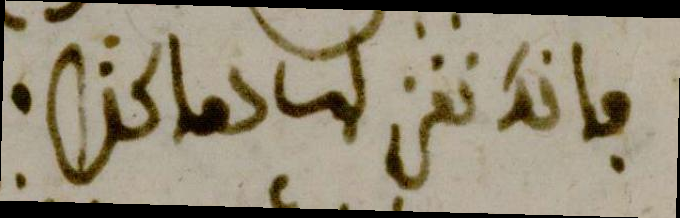فانك تنزل هاكذا
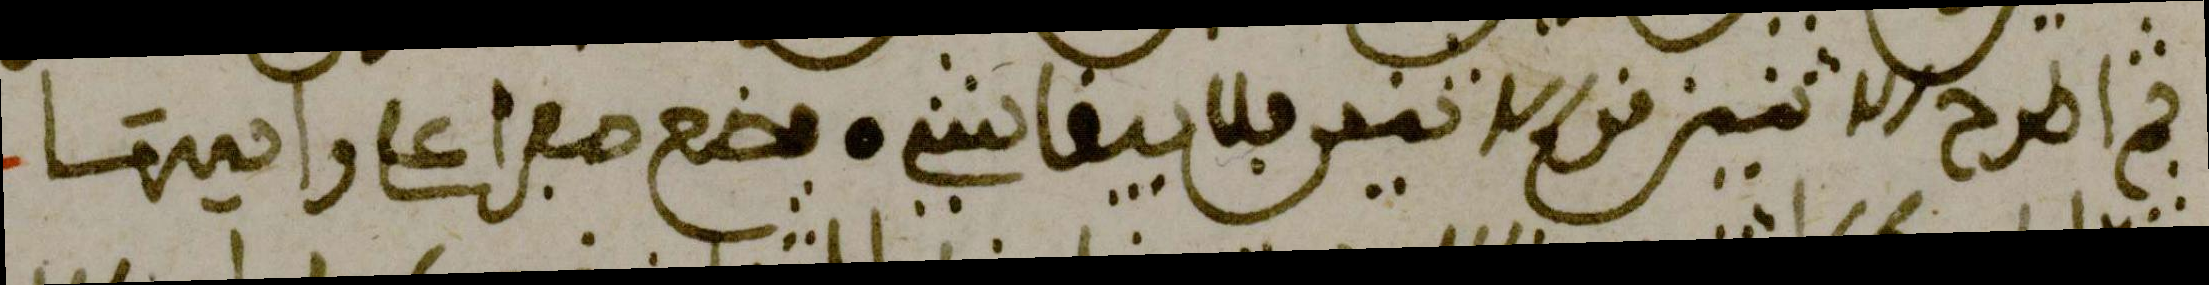ثم اطرح الاثنين من الاثنين فلا يبقا شيء فضع صفرا على راسها
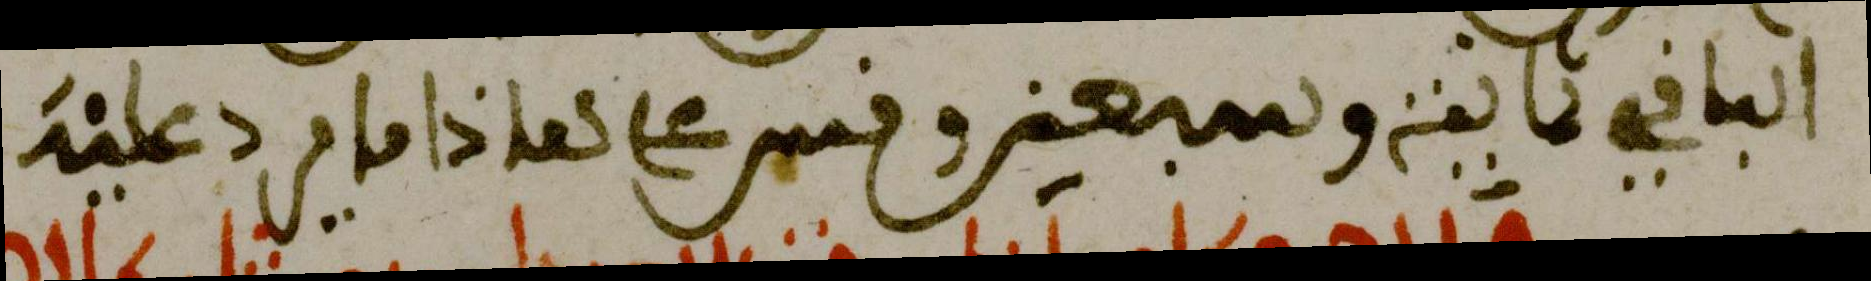الباقي ثمانية وسبعين وقس على هاذا ما يرد عليْك
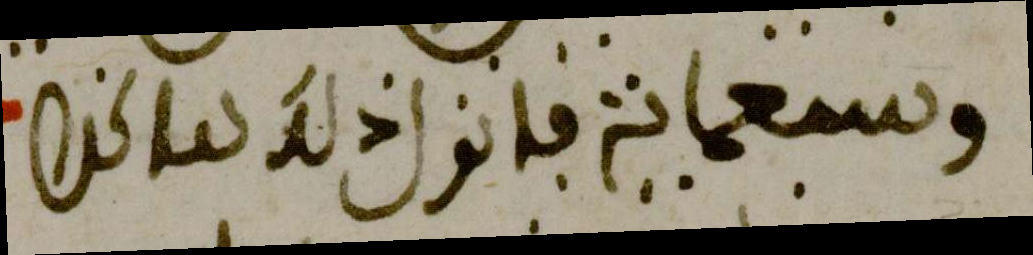وسبعماية فانزل ذلك هاكذا
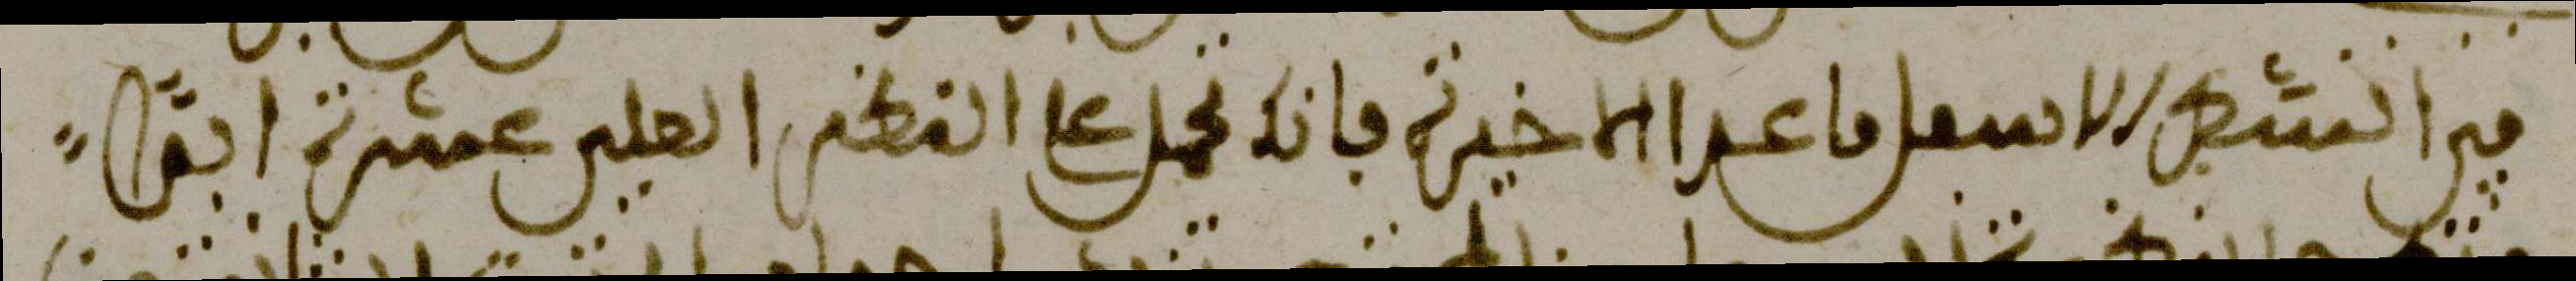في السّطر الاسفل ما عدا الاخيرة فانك تحمل على النظر العلي عشرة ابدًا
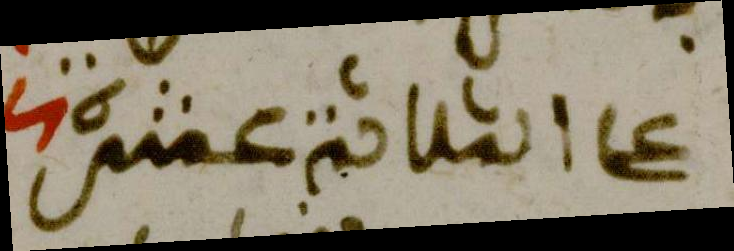على الثلاثة عشرة
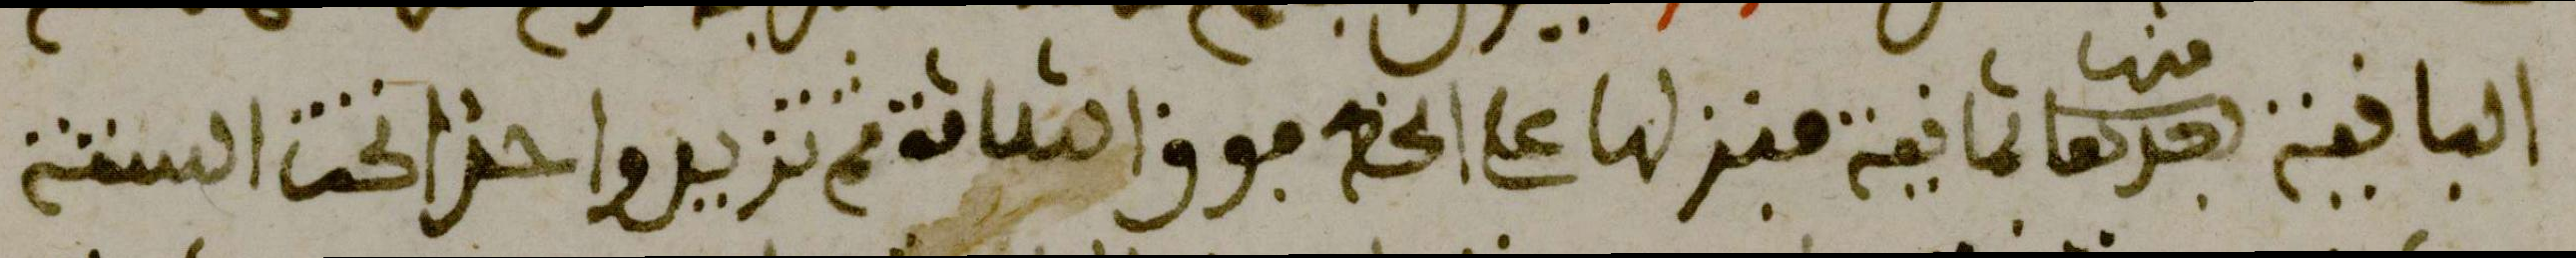الباقية لجرها ثمانية فنزلها على الخط فوق الثلاثة ثم تزيد واحدا تحت الستة
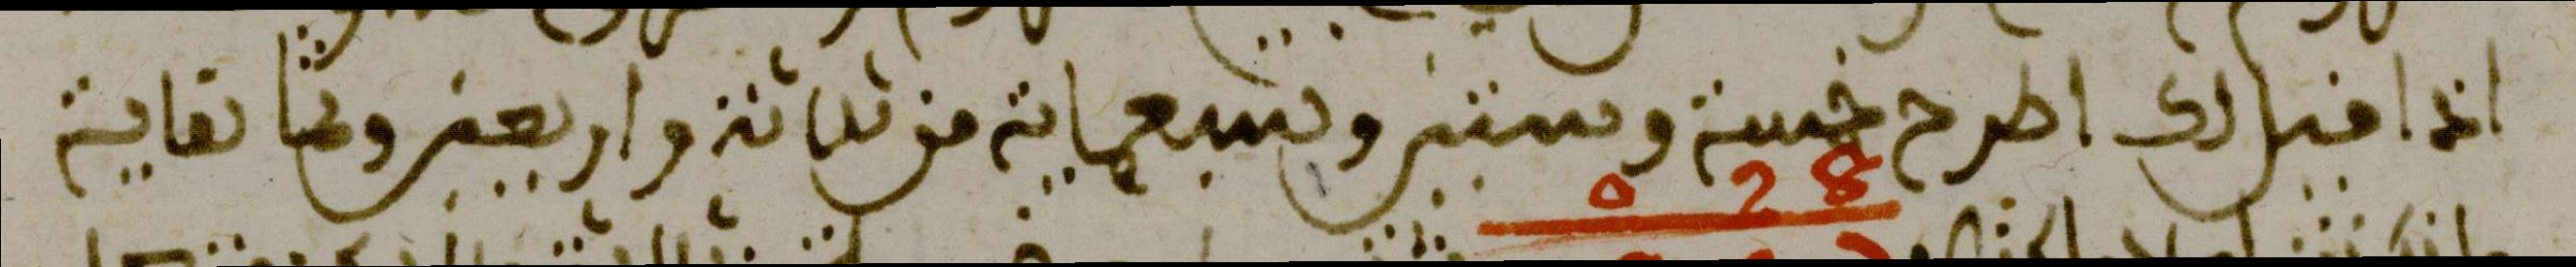اذا قيل لك اطرح خمسة وستين وسبعماية من ثلاثة واربعين وثمانماية
